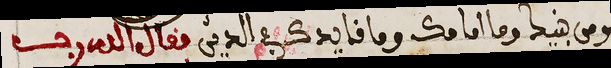ومن نبيك وما امامك و ما قايدك في الدين فقال الله رب
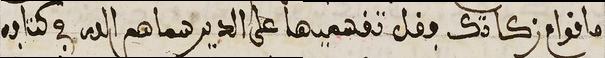ما قوام زكاتك فقل تقسميها على الدين سماهم الله فى كتابه
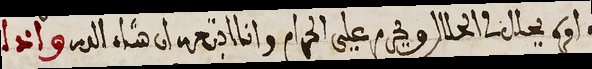ءامره يحللنا الحلال ويحرم علي الحرام وانا اتبعه ان شاء الله واذا
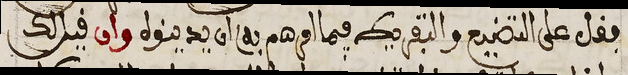فقل على التضيع والتفريط فيما امرهم بهم ان يد ينوه و ان قيل لك
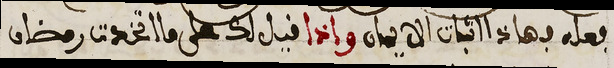فعله فهاذا اثبات الايمان و اذا قيل لك على ما اتخدت رمضان
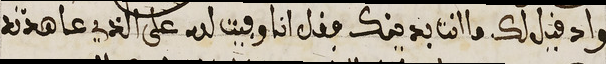و اذ قيل لك ما انت بدينك فقل انا وفيت لله على الذي عاهدته
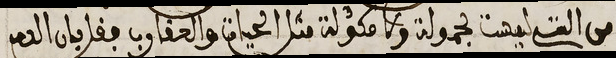من التم ليست بحمولة ولا مكولة مثل الحيات والعقارب فقل بان الله
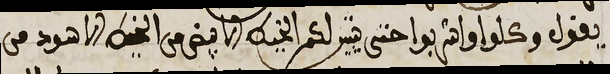يقول و كلوا و اشربوا حتى يتبين لكم الخيط الابيض من الخيط الاسود من
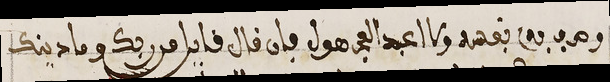وصف به نفسه ولا اعبد المجهول فان قال قايل من ربك و ما دينك
